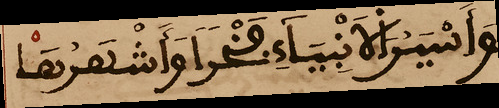وأسير الانبياء فخرا وأشهرها
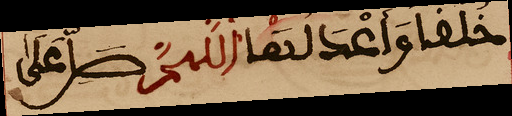خلقا وأعدلها اللهم صل على
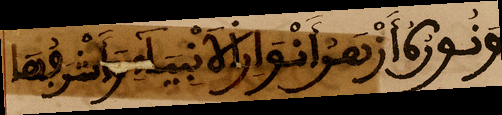نوره أزهر أنوار الانبياء وأشرفها
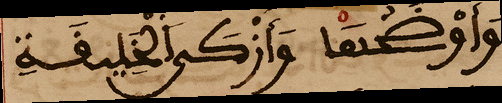وأوضحها وأزكى الخليقة
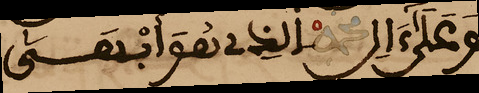وعلى آءال محمد الذي هو أبهى
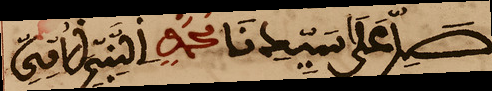صل على سيدنا محمد النبي الامي
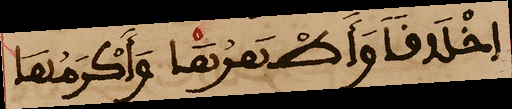اخلاقا وأطهرها وأكرمها
